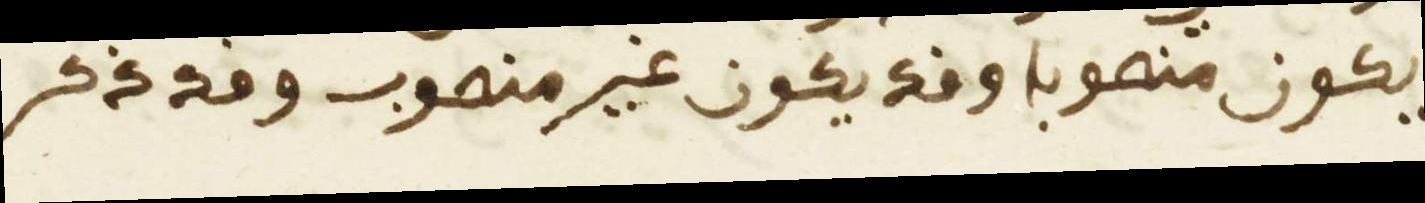يكون منصوبا و قد يكون غير منصوب و قد ذكر
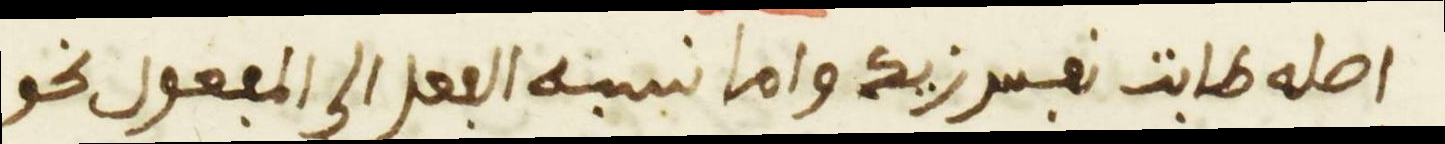اصله طابت نفس زيد واما نسبه الفعل الى المفعول نحو
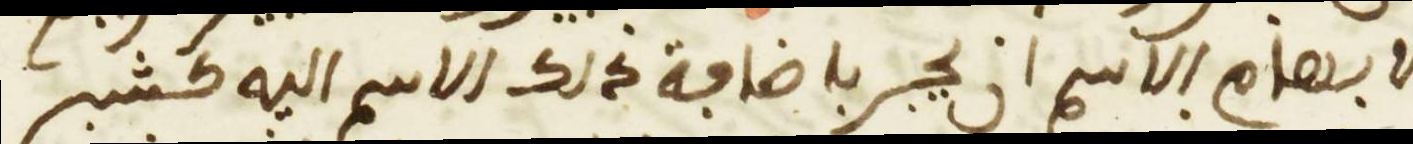لابهام الاسم ان يجر باضافة ذلك الاسم اليه كشبر
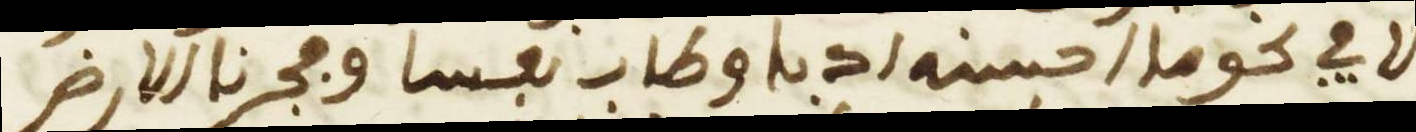لا في نحو ما احسنه ادبا و طاب نفسا و فجرنا الارض
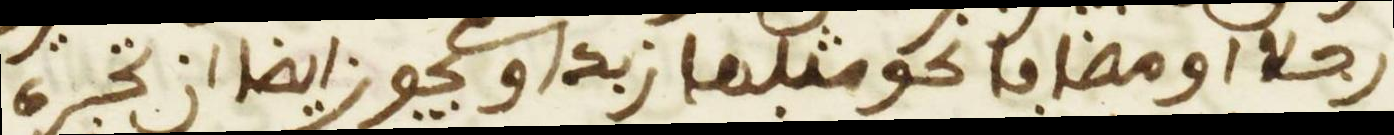رجلا او مضافا نحو مثلها زيدا ويجوز ايضا ان تجره
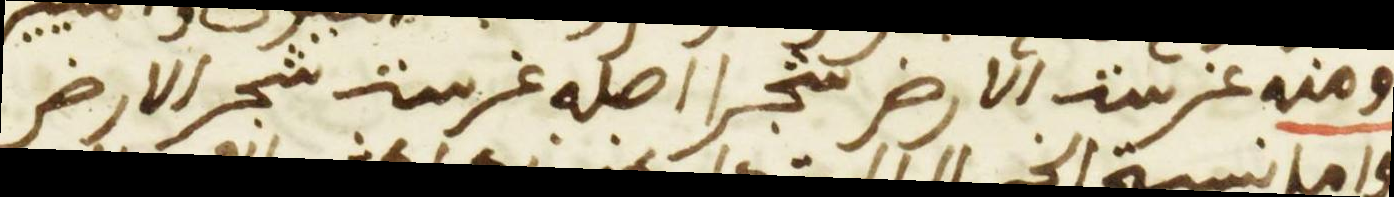ومنه غرست الارض شجرا اصله غرست شجر الارض
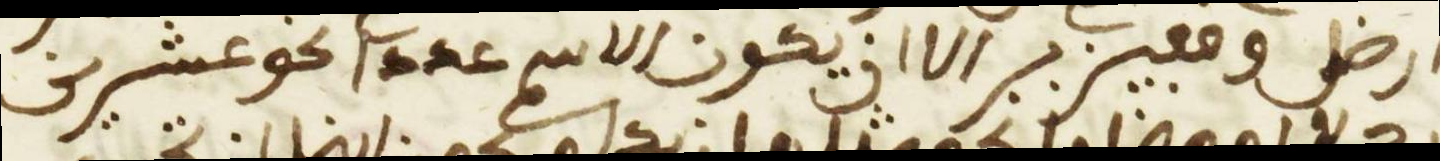ارض وقفيز بر الا ان يكون الاسم عددا نحو عشرين
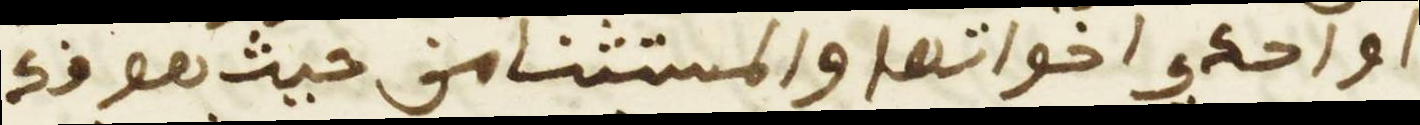او احدي اخواتها و المستثنا من حيث هو قد
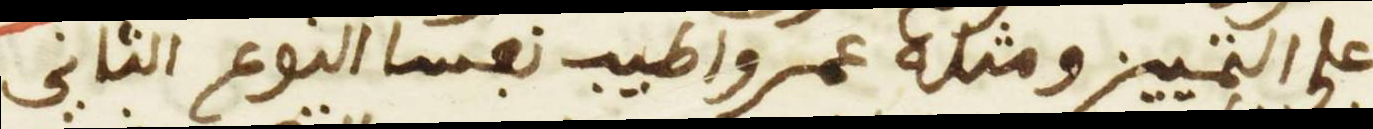على التمييز ومثله عمرو اطيب نفسا النوع الثاني
